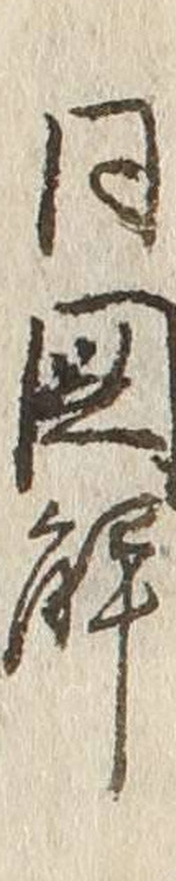同図解
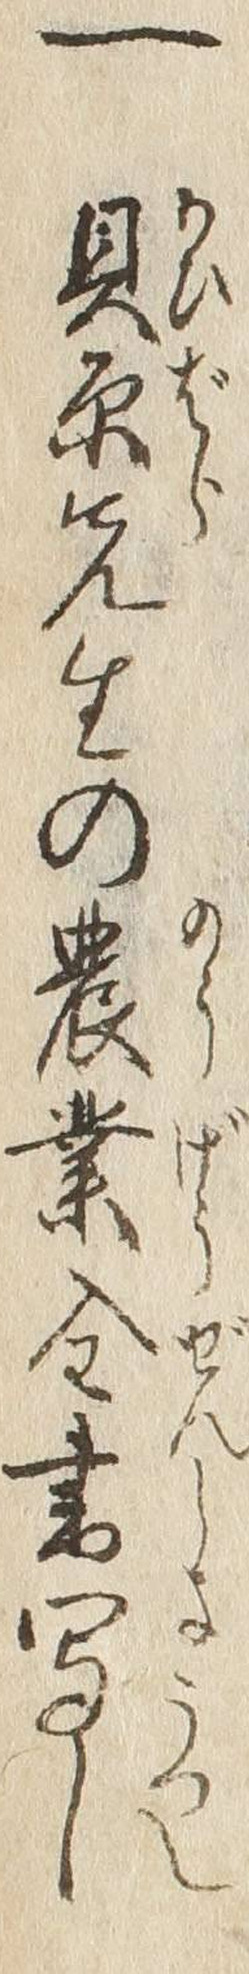一貝原先生の農業全書写し十ウ

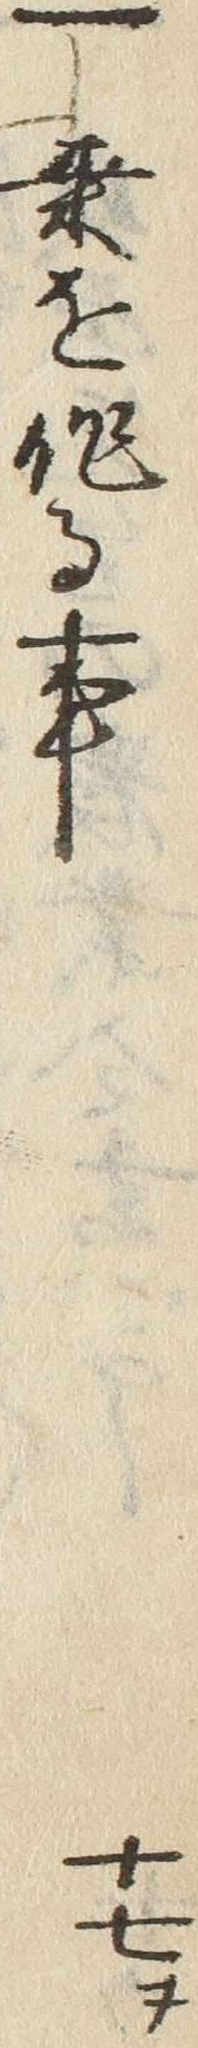一桑を作る事十七ヲ
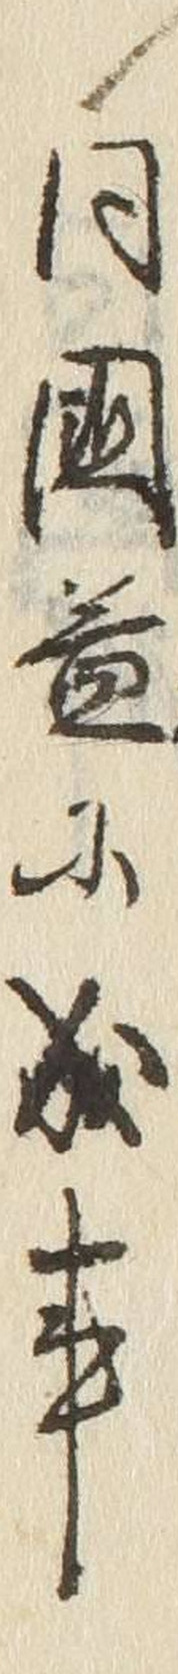同國益尓成事
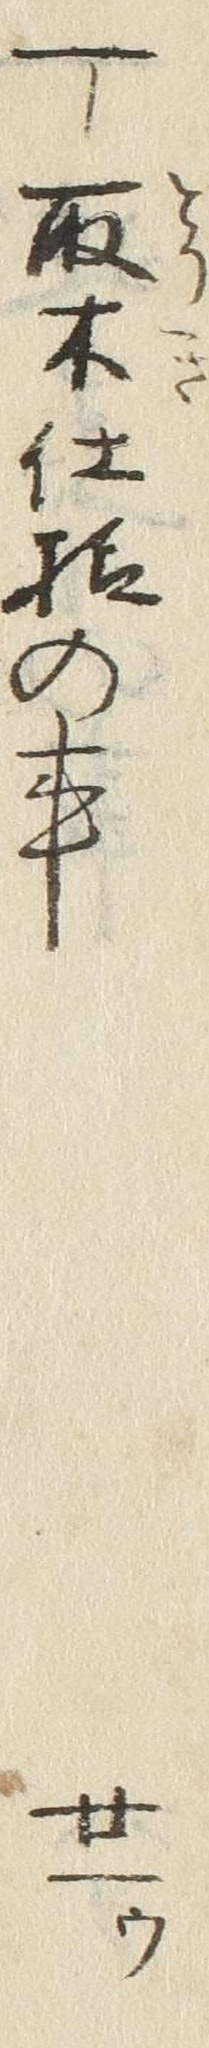一取木仕様の事廿一ウ
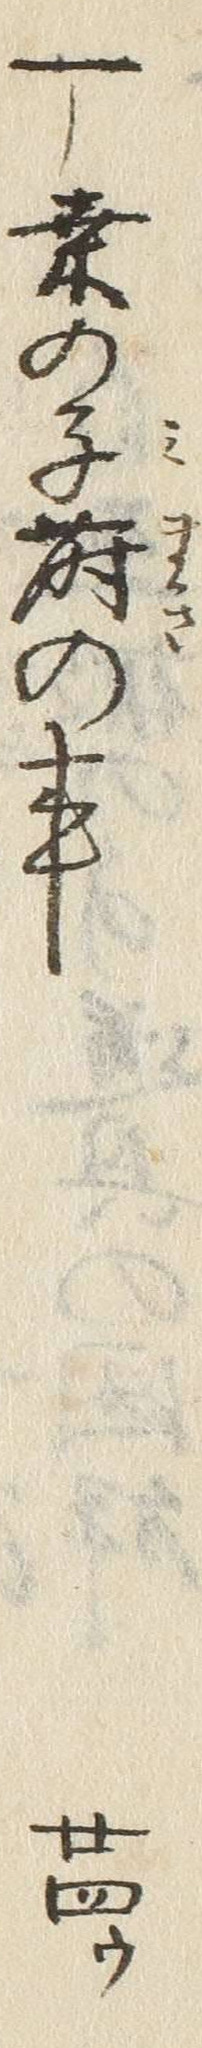一桑の子蒔の事廿四ウ
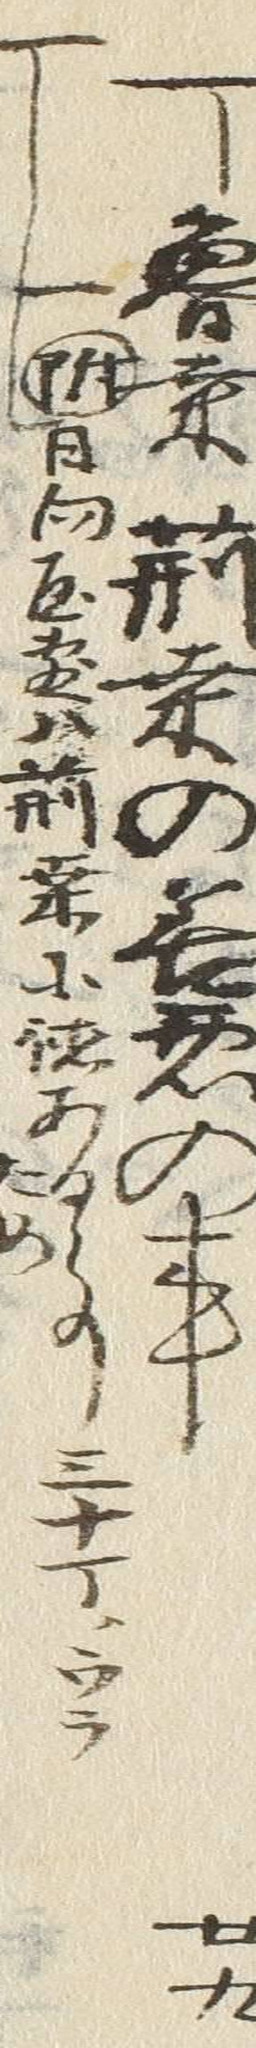一附日向屋敷は荊桑尓徳ある事三十丁ノウラ
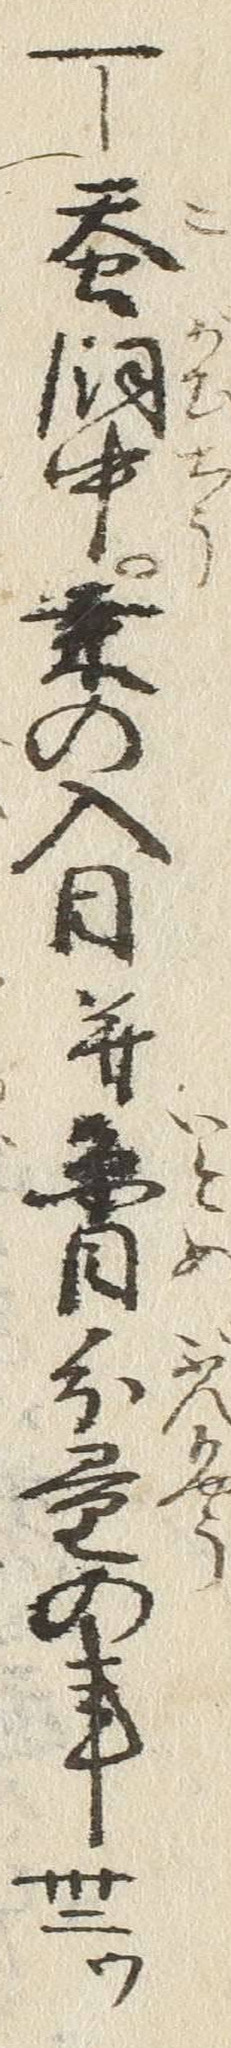一蚕飼中。桑の入日幷糸目分量の事卅二ウ
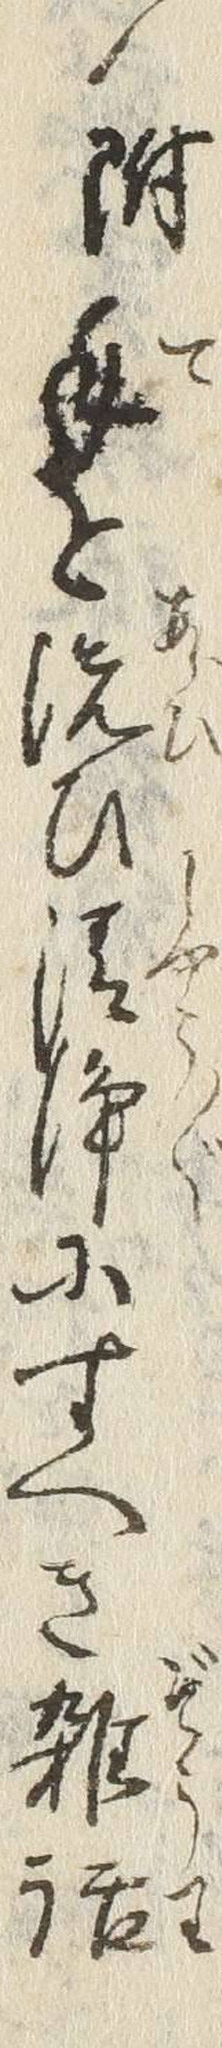附手を洗ひ清浄尓すへき雑話
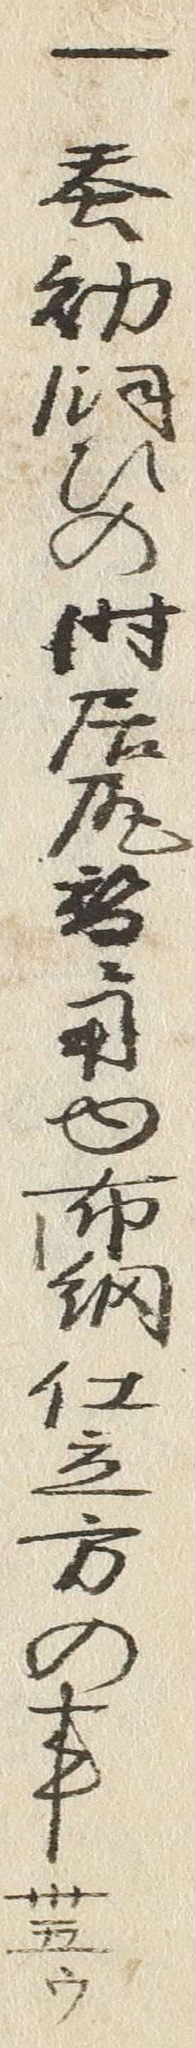一蚕幼飼ひの時居尻替に用ゆ布網仕立方の事卅五ウ
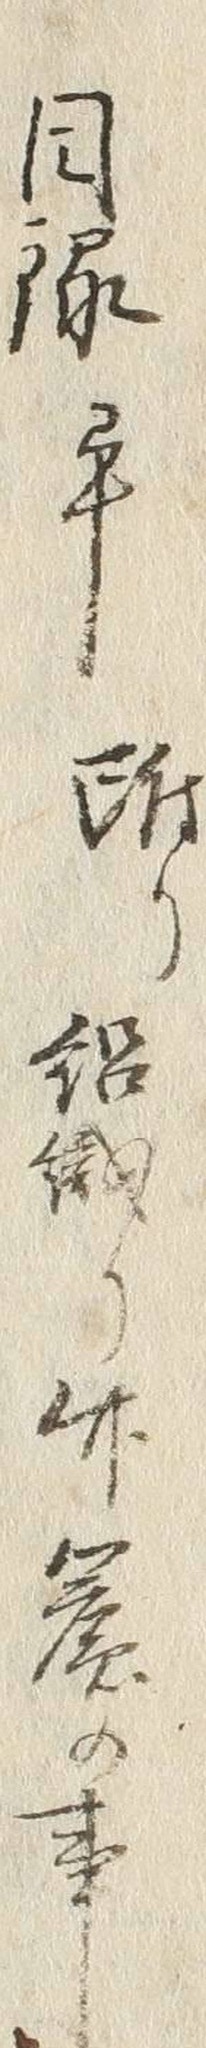同録畢附り絽織り竹炭の事

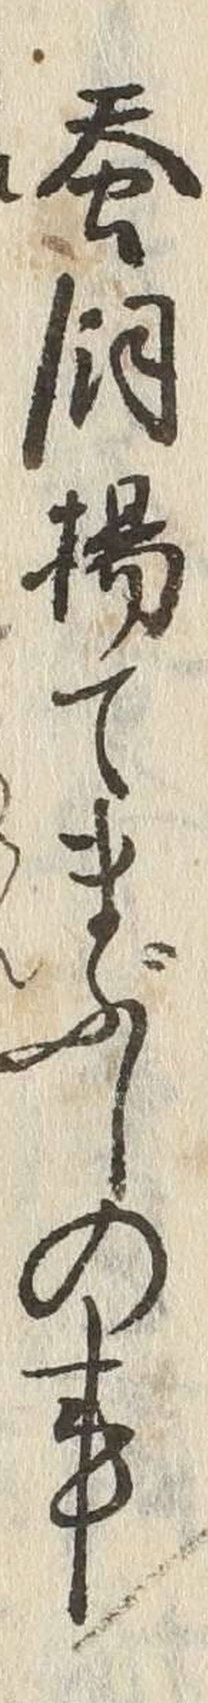蚕飼揚てまぶしの事
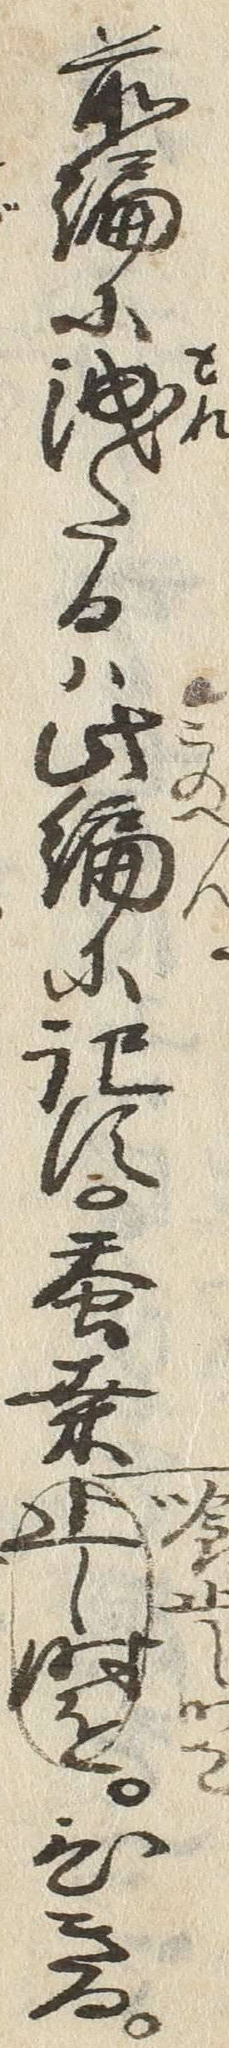前編尓洩たるは此編尓記須。蚕桑喰止し時を。飛きる。
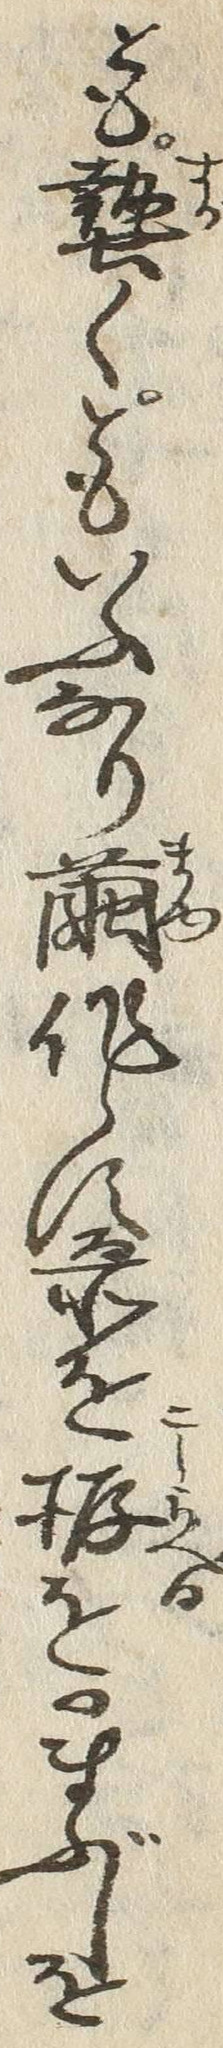とも。蟄く。ともいふなり繭作ら須る所を拵を。まぶしを
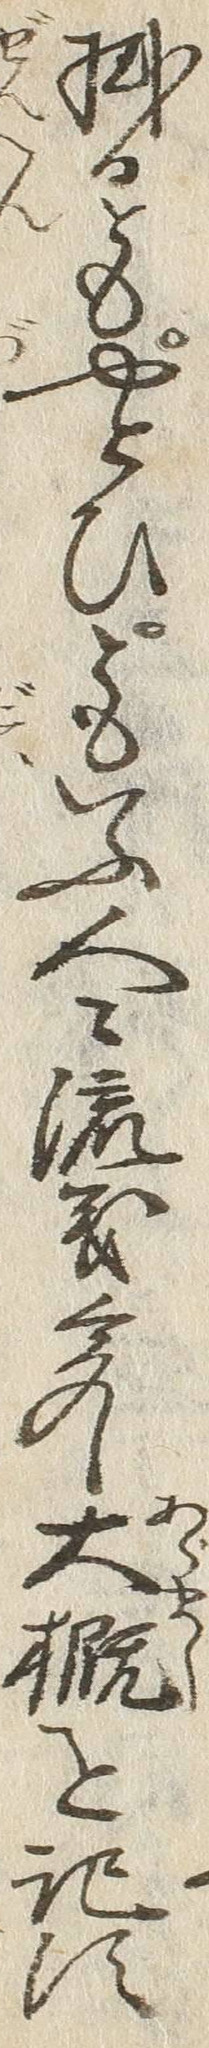掛るとも。やとひ。ともいふ人々流義多し大概を記須
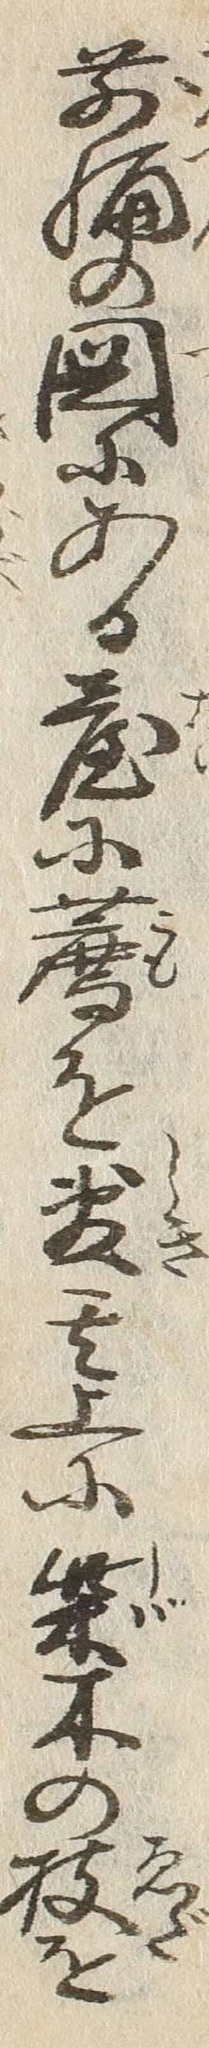前編の図尓ある臺尓薦を敷其上尓柴木の枝を
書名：養蠶實驗録後編
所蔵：東京大学農学生命科学図書館 国文学研究資料館
